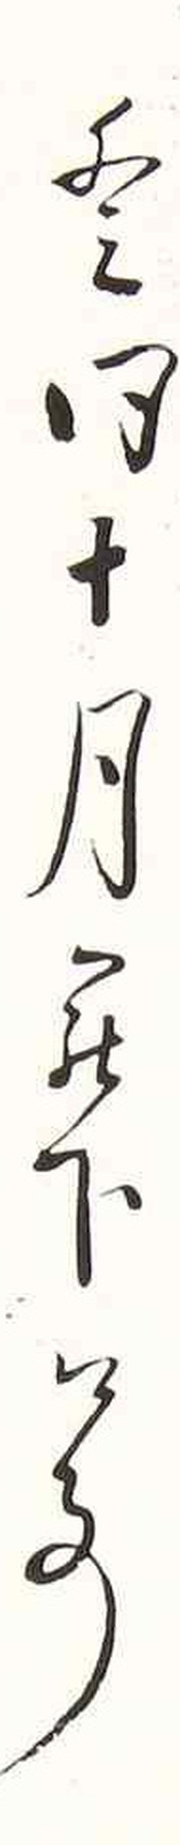登同十月罷下候事
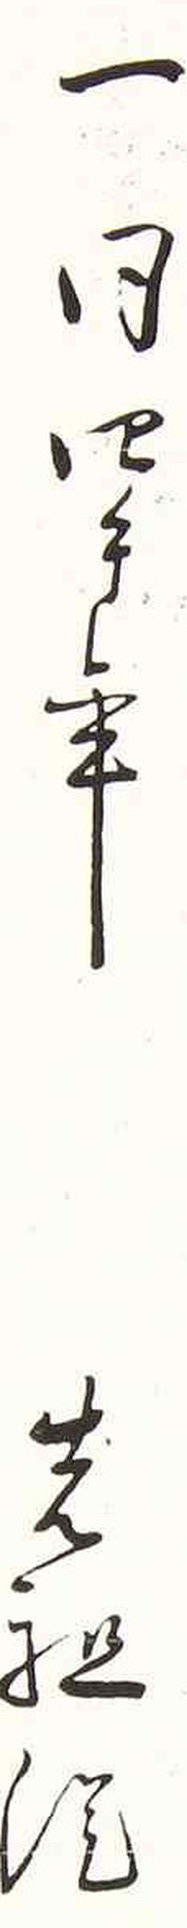一同四午年先祖従
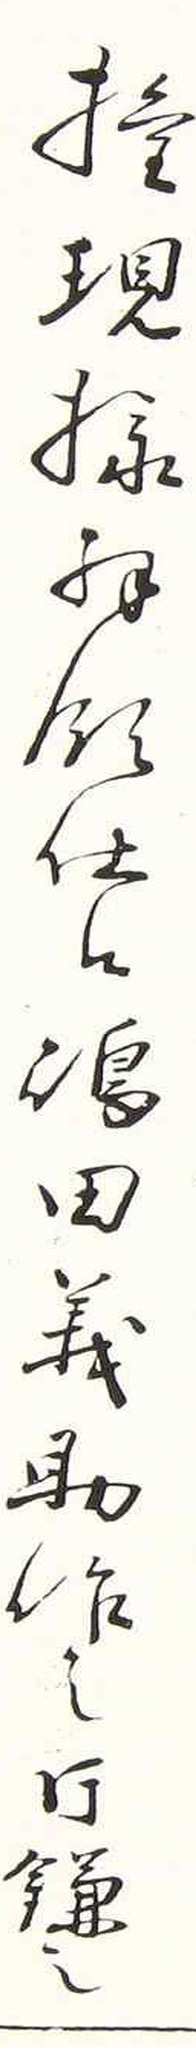権現様拝領仕候島田義助作之片鎌之
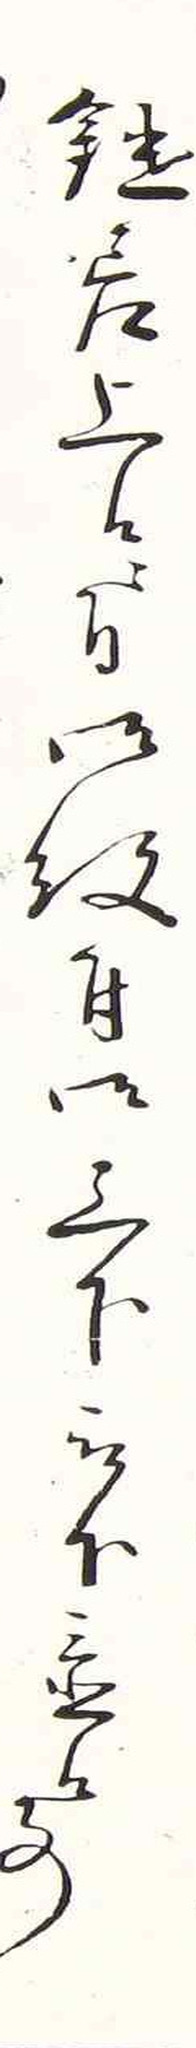鑓差上候ニ付御紋付御上下被下置候事
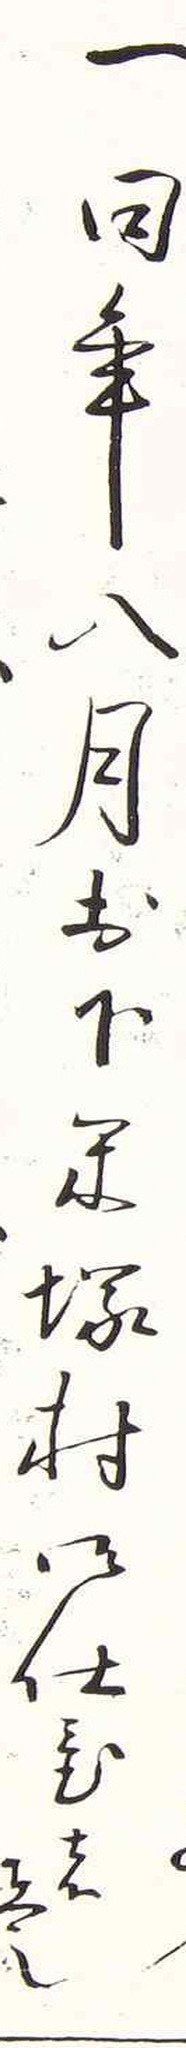一同年八月於下米塚村御仕置者在之
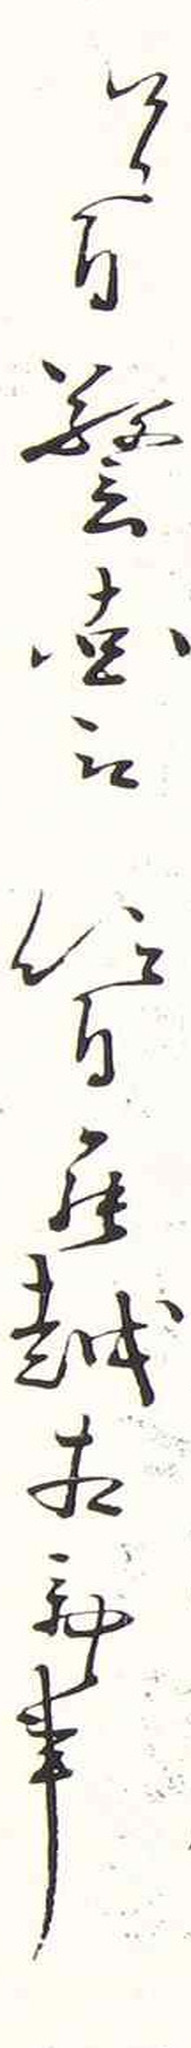候ニ付警固被仰付罷越相勤候事
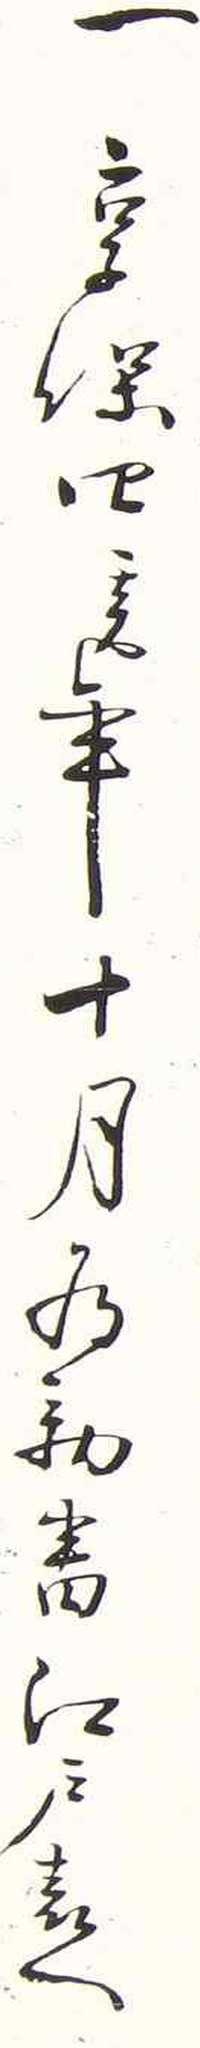一享保四亥年十月為勤番江戸表へ
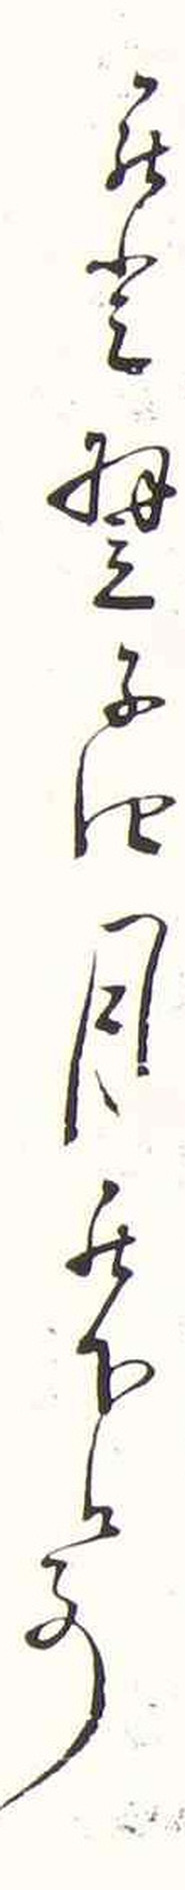罷登翌子四月罷下候事

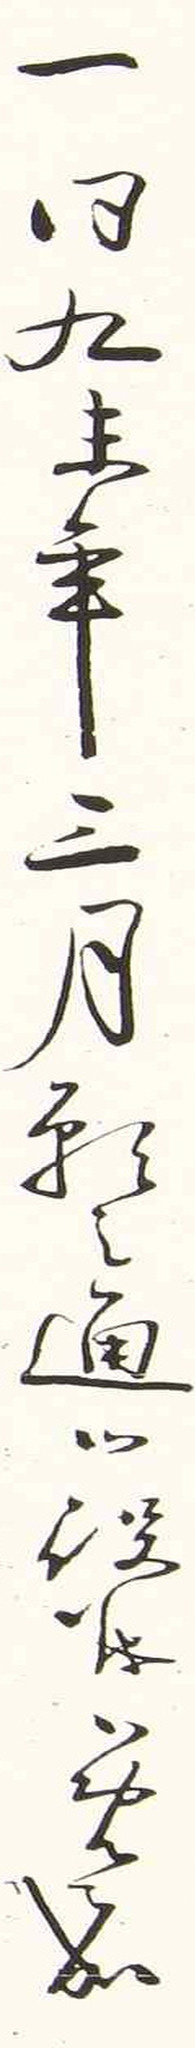一同九未年三月願之通御役義御免被成
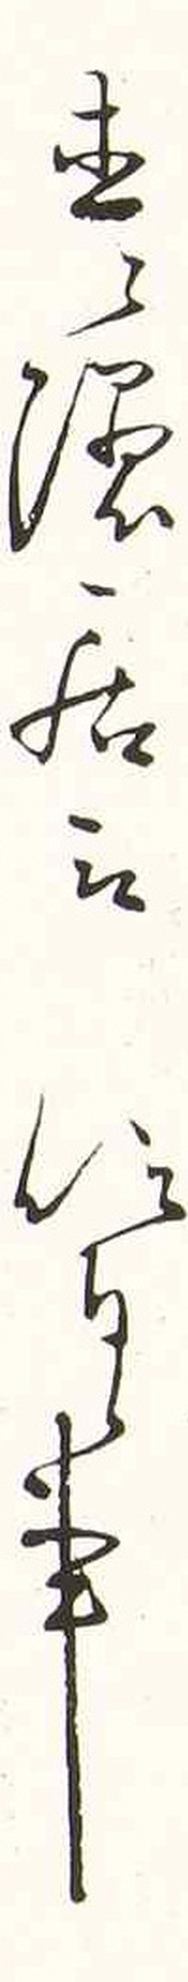直ニ隠居被仰付候事
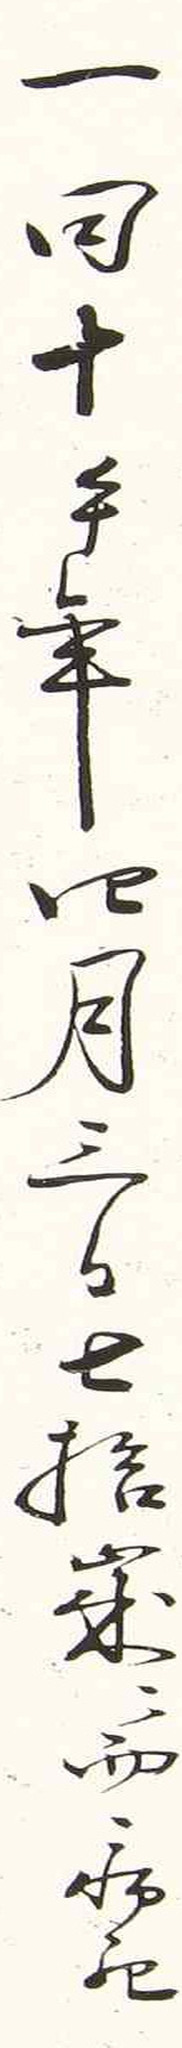一同十午年四月三日七拾歳ニ而病死
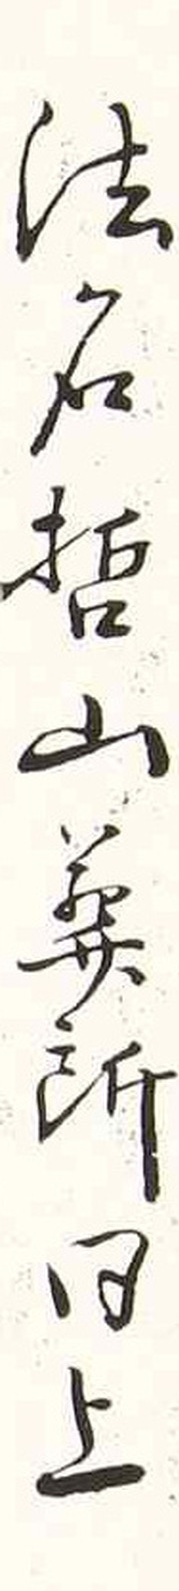法名哲山葬所同上
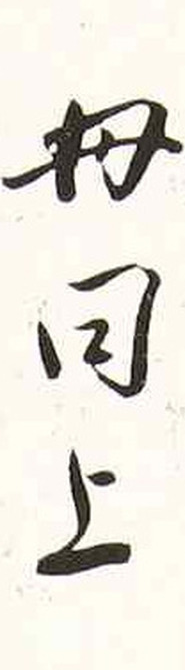母同上
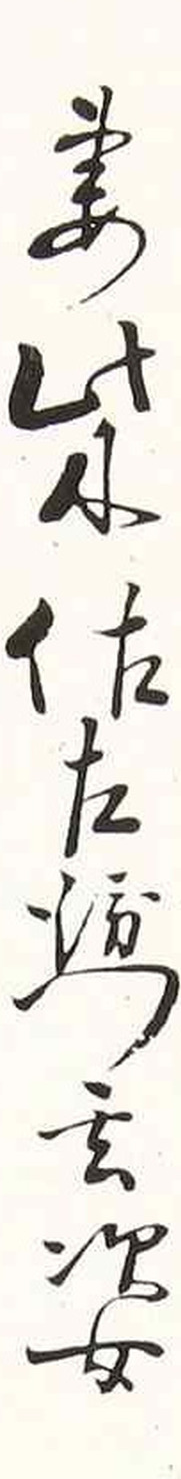妻柴佐左衛門玄次女
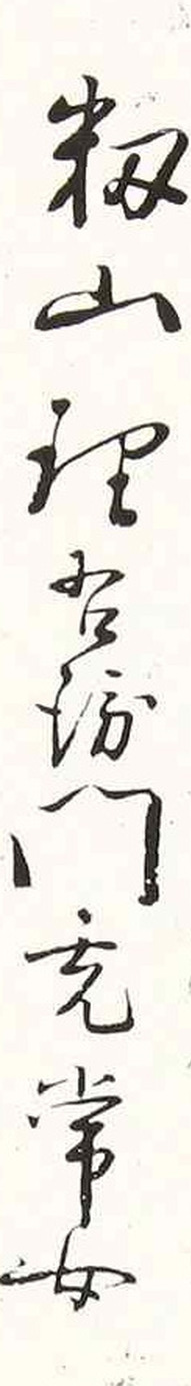籾山理右衛門玄常女
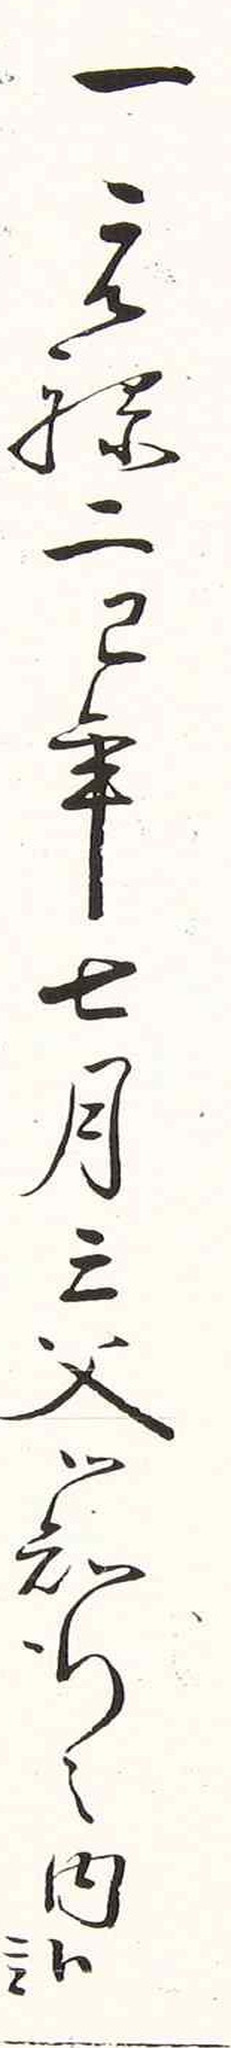一元禄二巳年七月亡父御知行之内弐
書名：諸士系譜　巻之357　す之部7
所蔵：会津若松市立会津図書館
